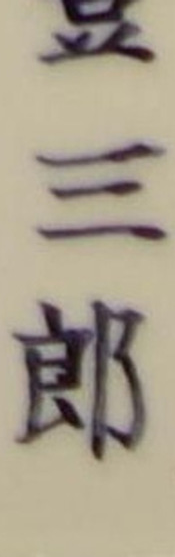豊三郎
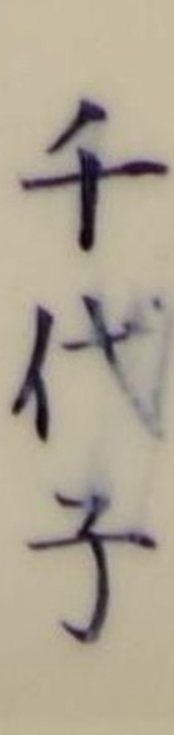千代子
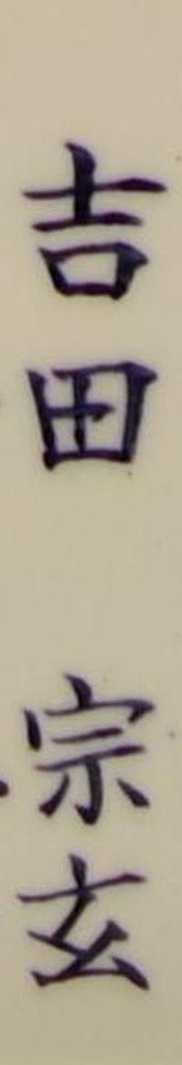吉田宗玄
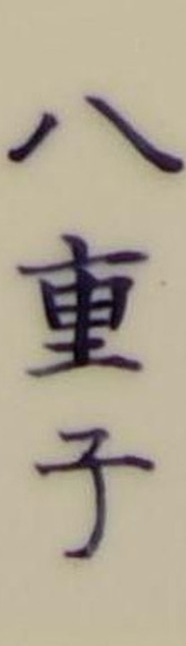八重子

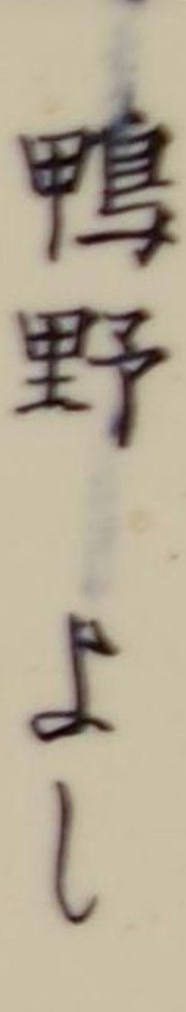鴨野よし
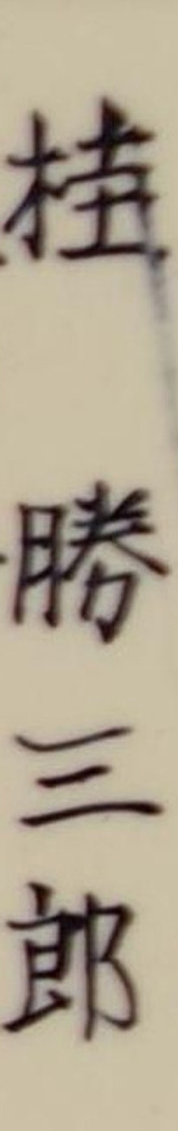桂勝三郎
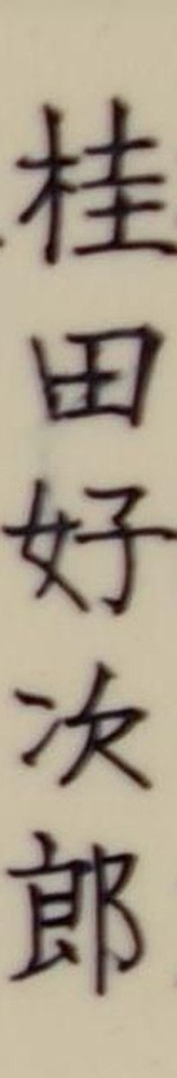桂田好次郎
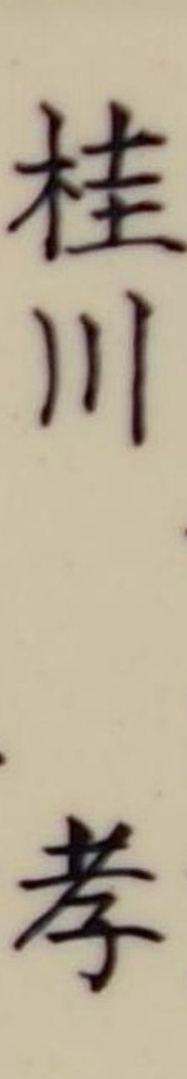桂川孝
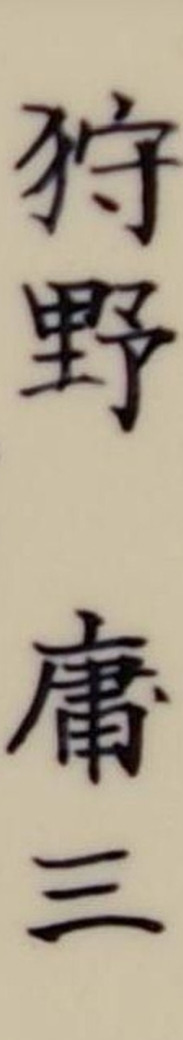狩野庸三
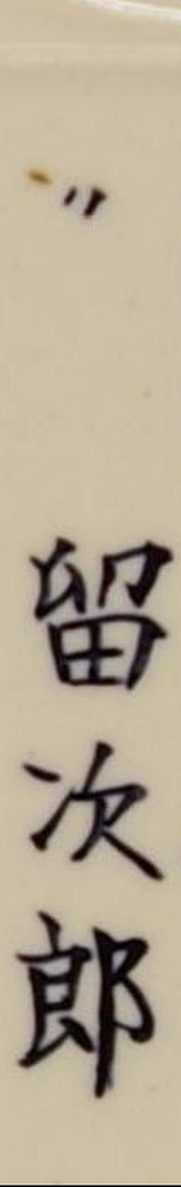留次郎
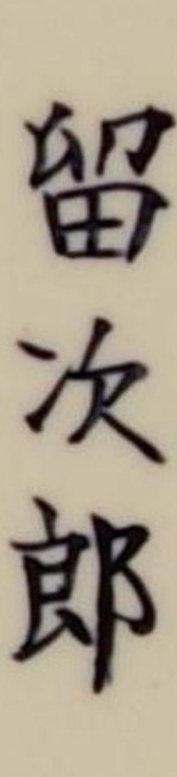留次郎
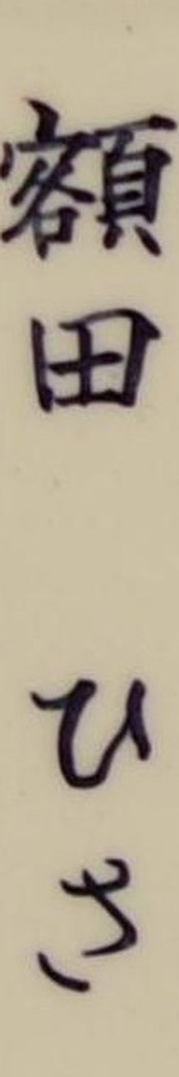額田ひさ
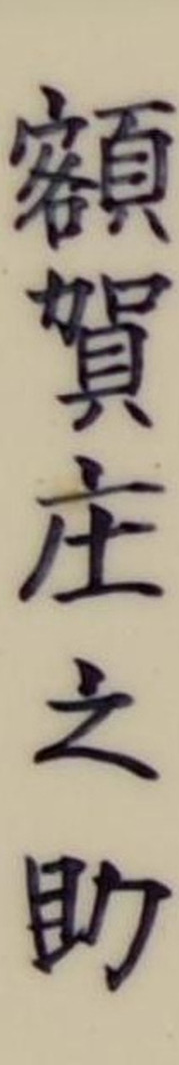額賀庄之助
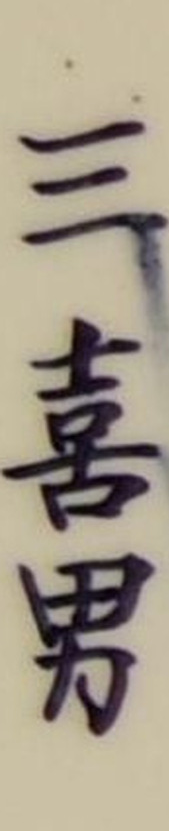三喜男

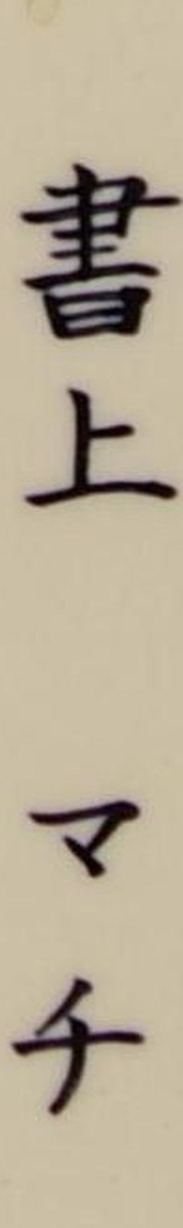書上マチ
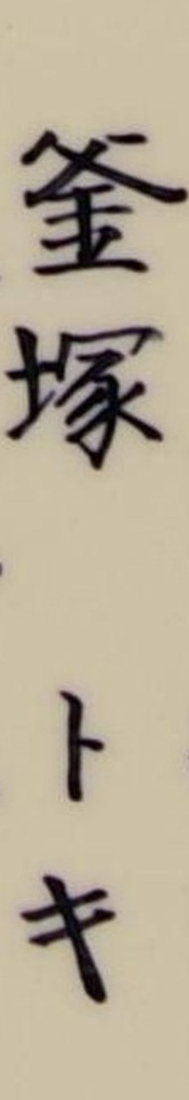釜塚トキ
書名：E~L
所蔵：高野山金剛峯寺
